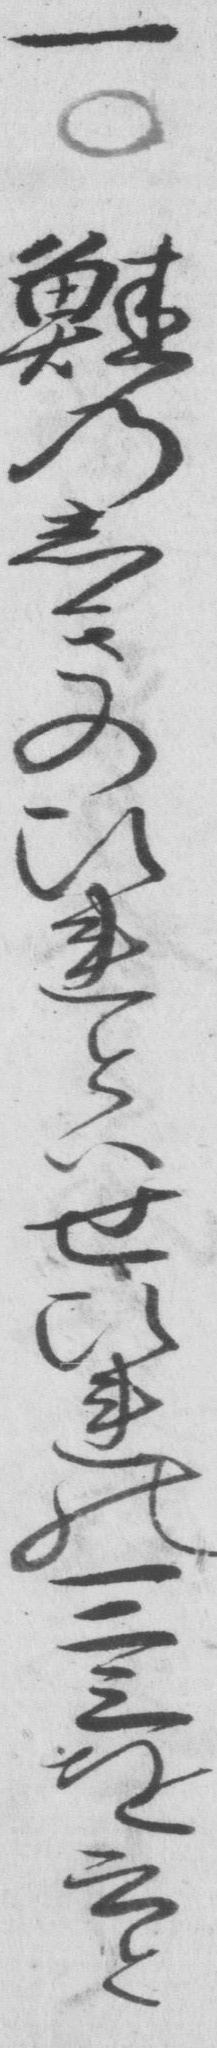一○鮭のしきのひれとはせひれの一二三を云と
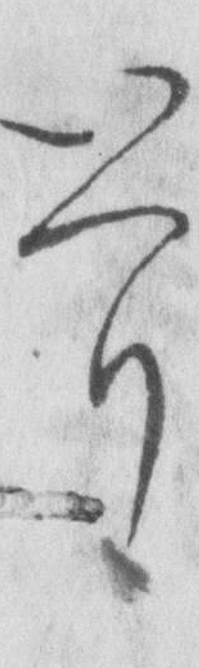いへり
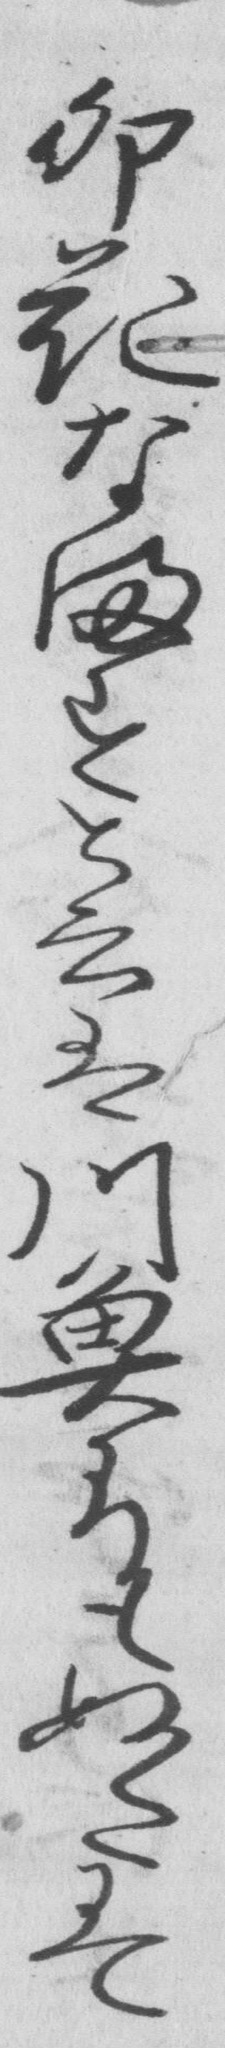一○卯花なますと云は川魚にてもぬたにて
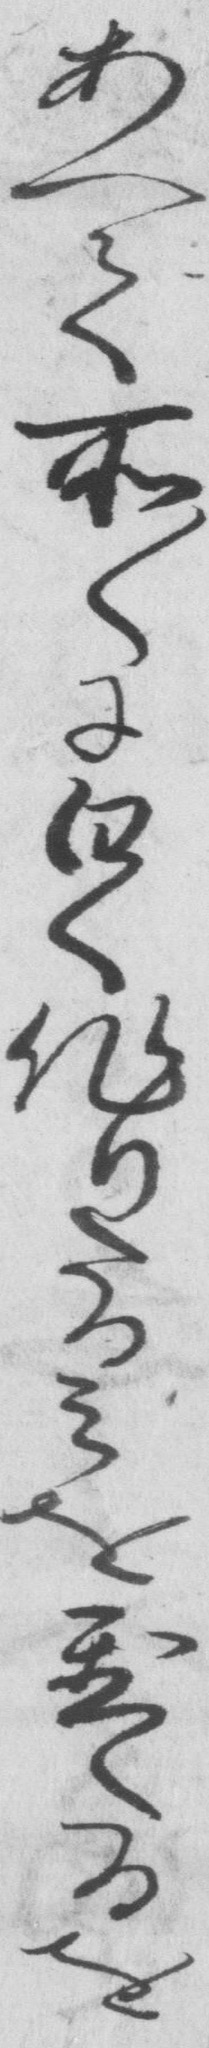あへて所々に白く作りたるみを置たるを
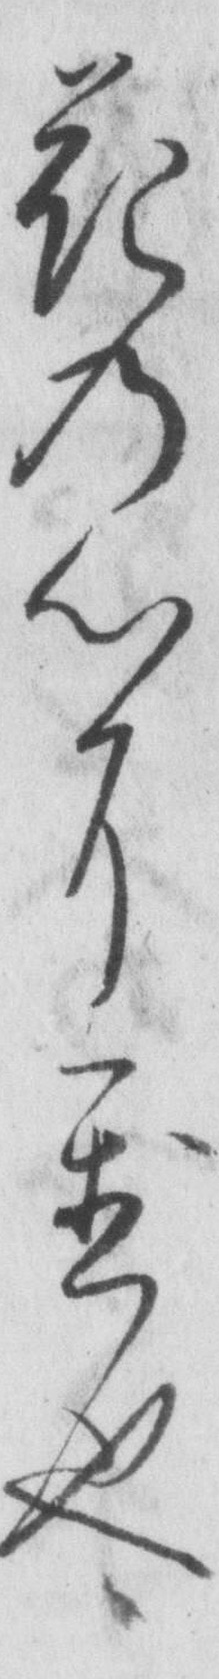花の心に置也
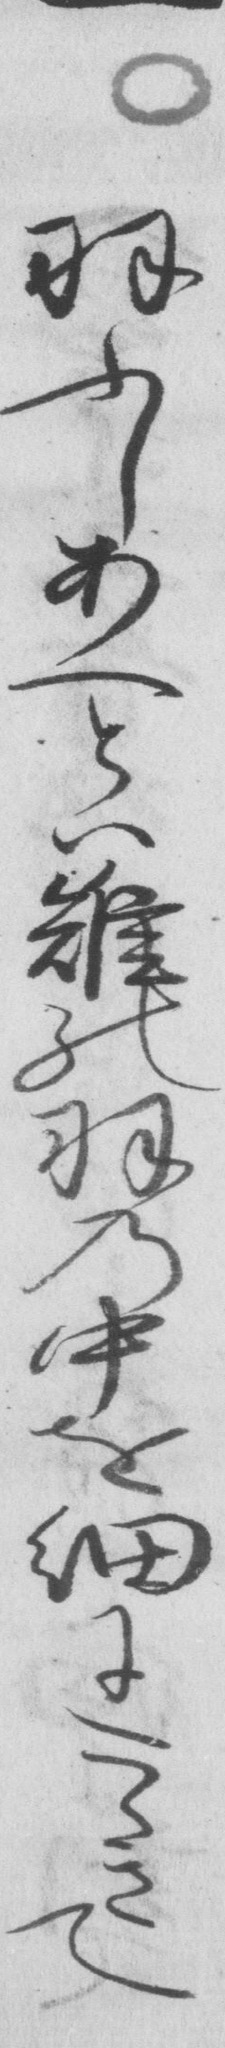一○羽ふしあへとは雉の羽の中を細にたゝきて
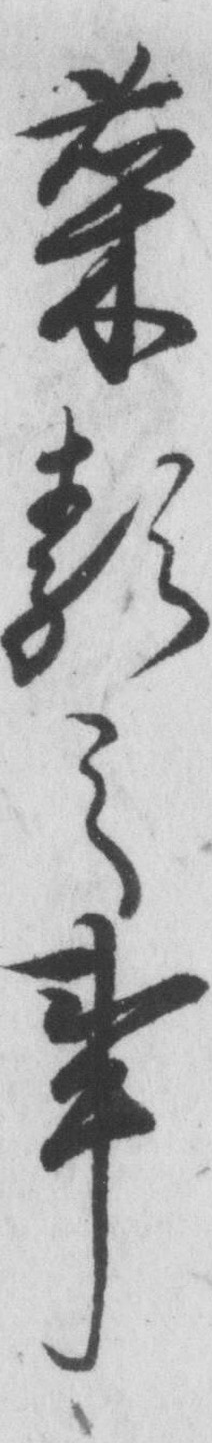葉類之事
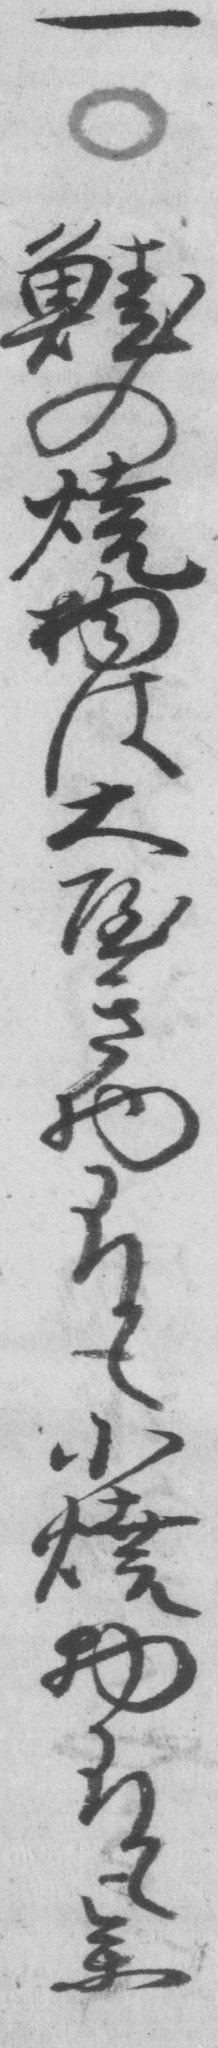一○鮭の焼物は大やき物にても小焼物にても参
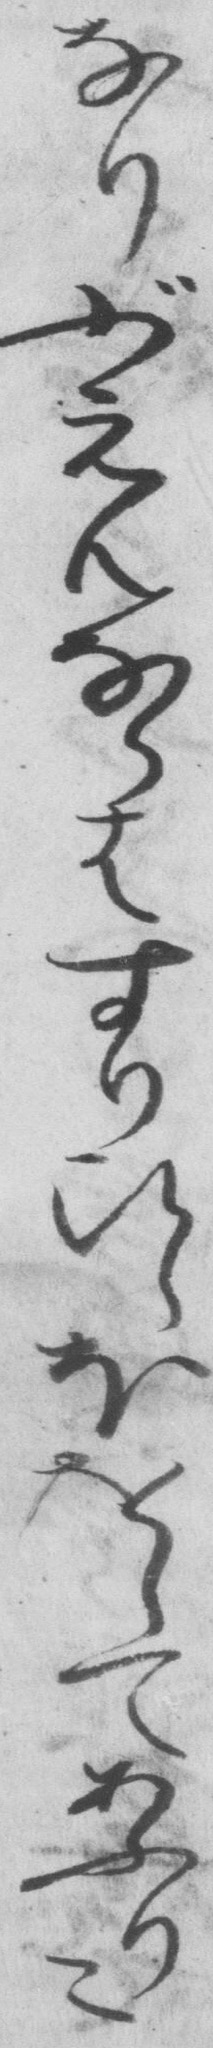なりぶえんならはすりひしほをしてあふりこ

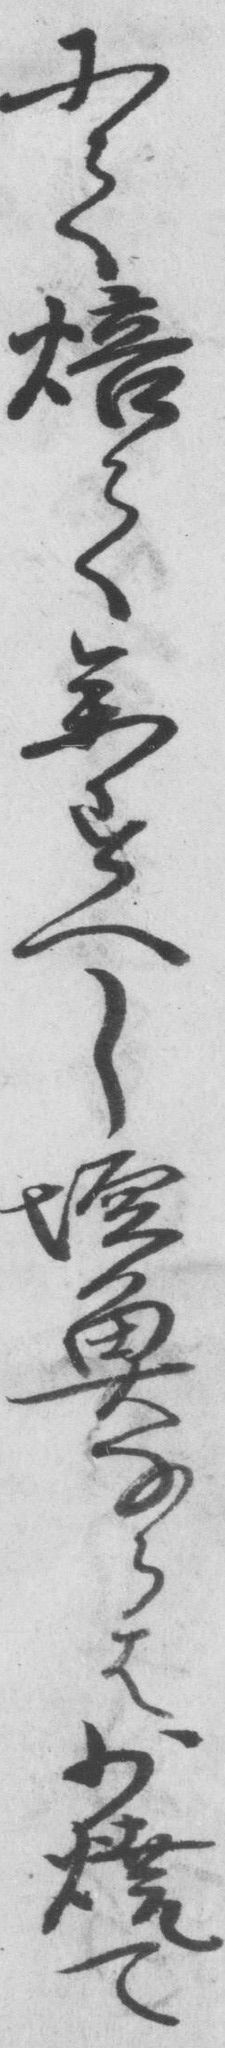にて焙て参すへし塩魚ならは少焼て
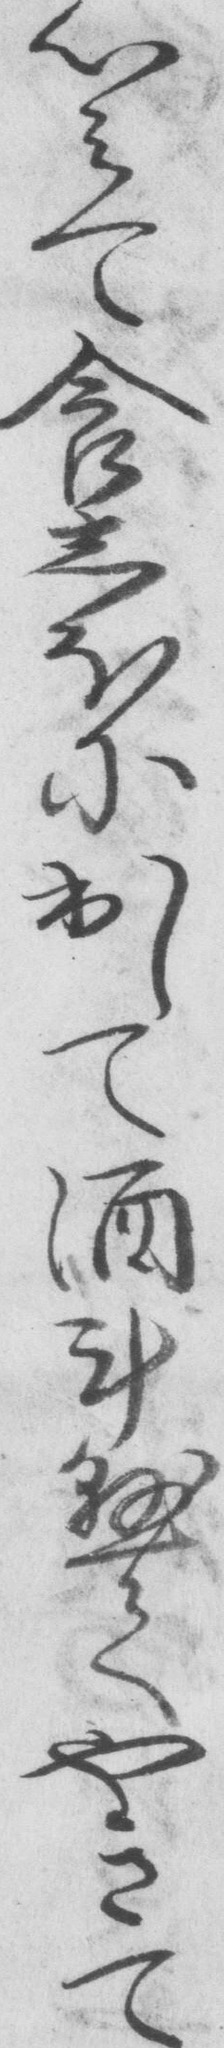心みて食しほに出して酒斗懸てやきて
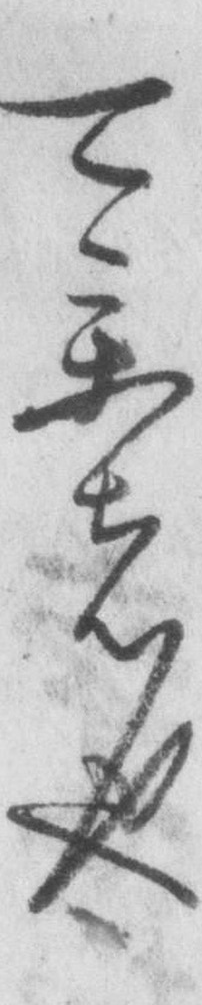可参者也
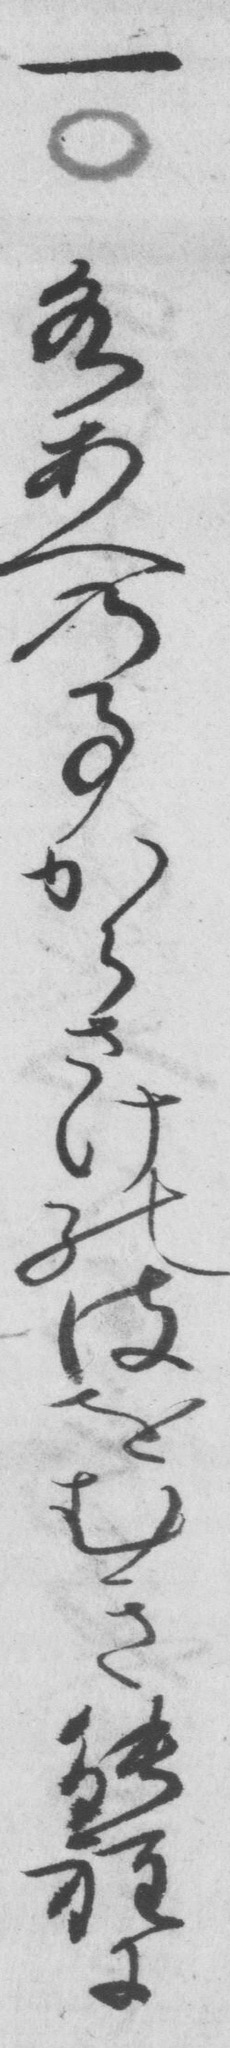一○水あへの事からさけの皮をむき能程に
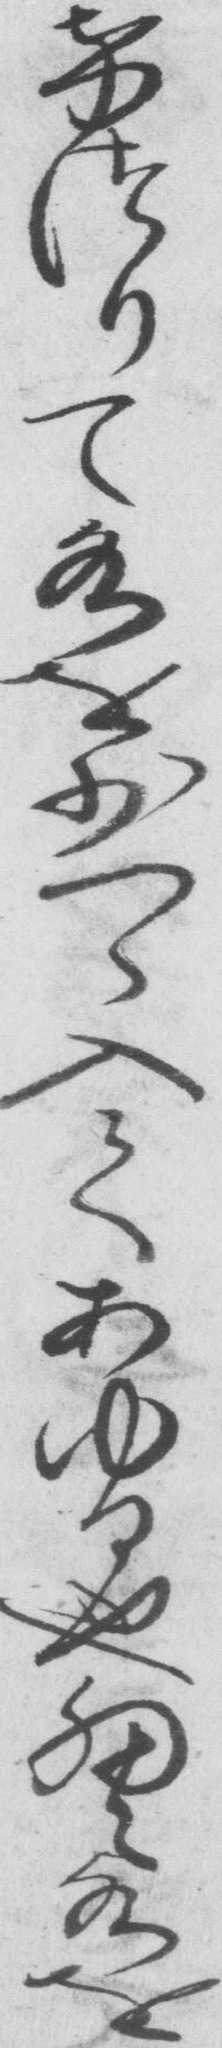けつりて水を少つゝ入てあゆる也細々水を
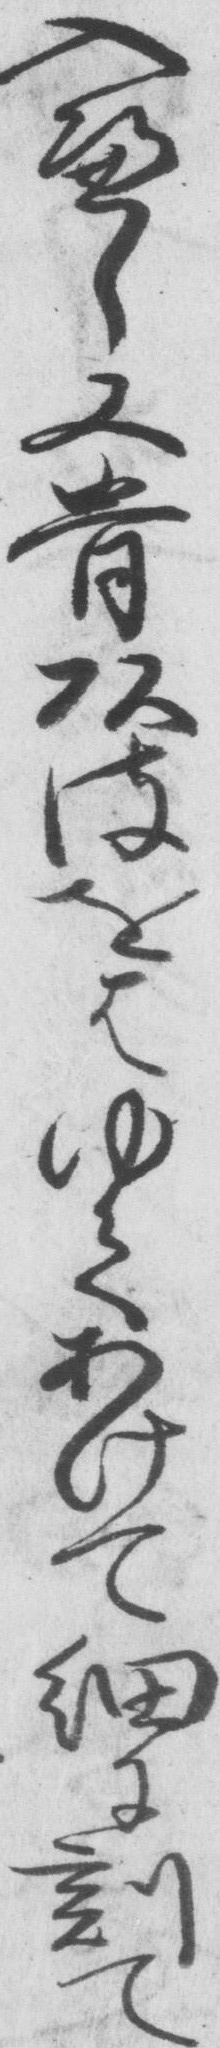入へし又骨頭皮をはゆてあけて細に割て
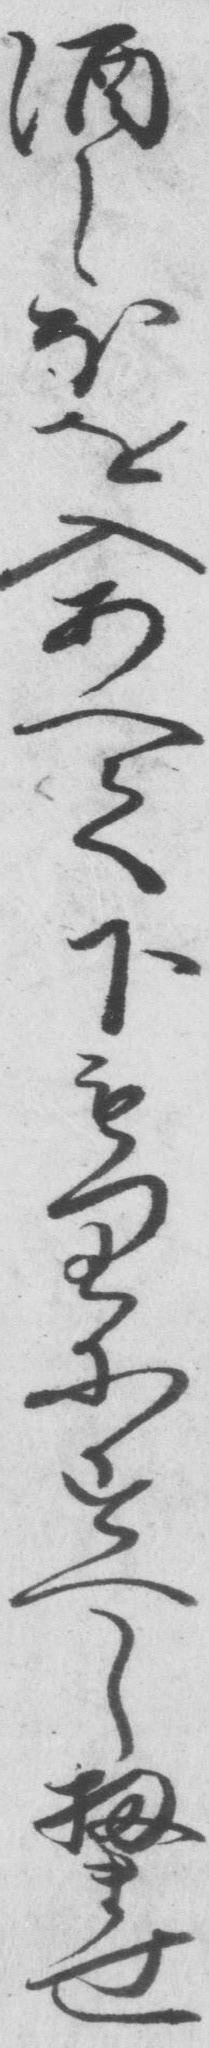酒しほを入あへて下もりにすへし扨ませ
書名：料理次第
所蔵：大阪府立大学学術情報センター 国文学研究資料館
